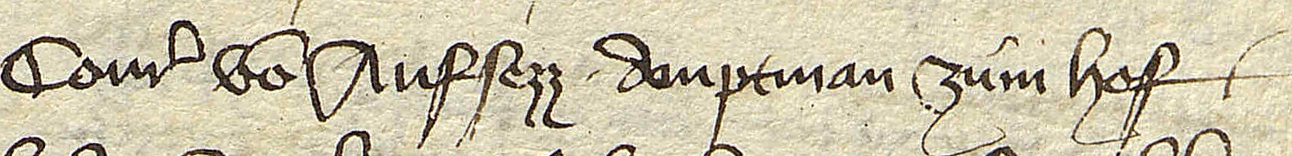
Conr* vo* Aufſeʒʒ Amptman cʒüm hof /
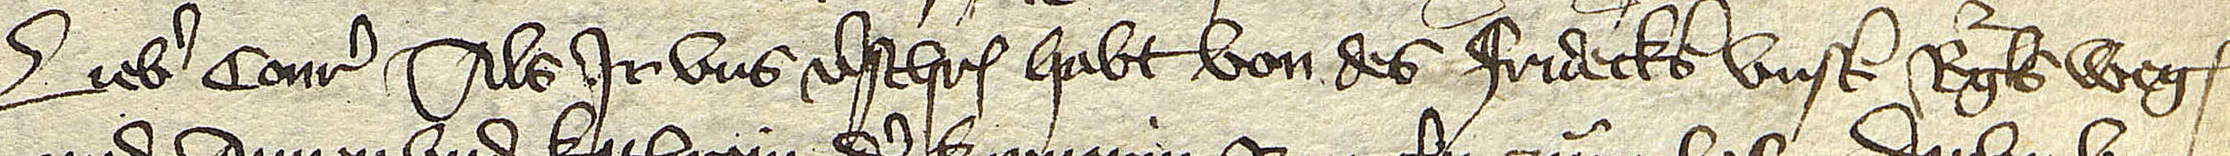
Lieb* Conr* / Als Ir vns v*ſchr* habt von des Fridecks* vnſ*s B*g*s weg*
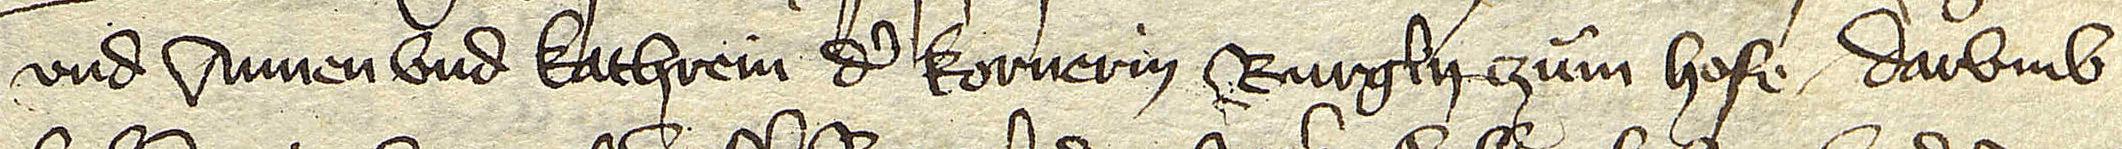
vnd Annen vnd Kathrein d* Kornerin Burg*in cʒüm hofe / darvmb
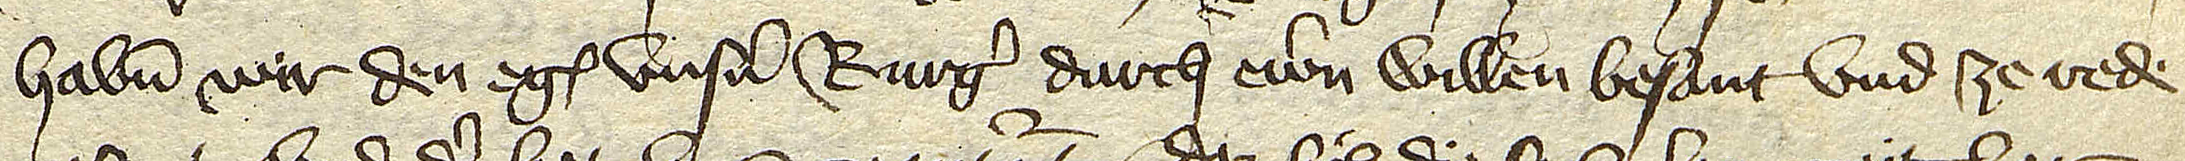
habn* wir den eg* vnſn* Burg* durch ewn* willen beſant vnd cʒe rede
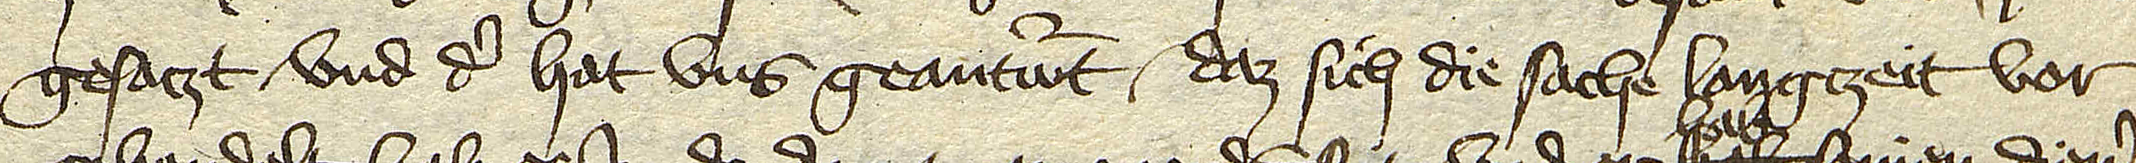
geſacʒt / vnd d* hat vns geantw*t / daʒ ſich die ſache langcʒeit vor
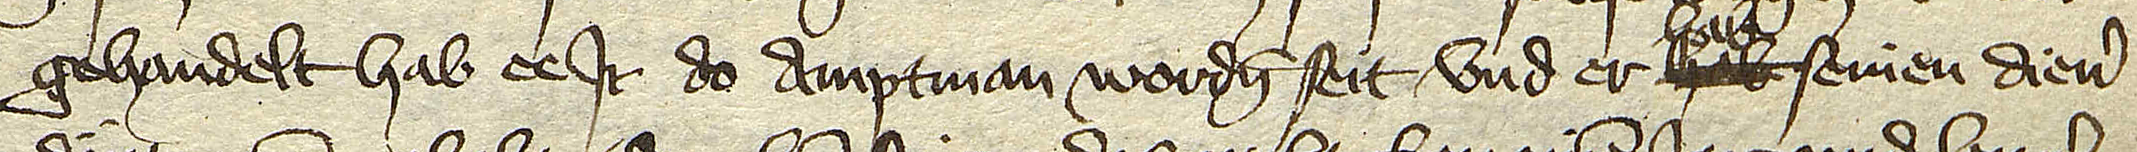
gehandelt hab ee Ir do Amptman wordn* ſeit / vnd er hab ſeinen dien*
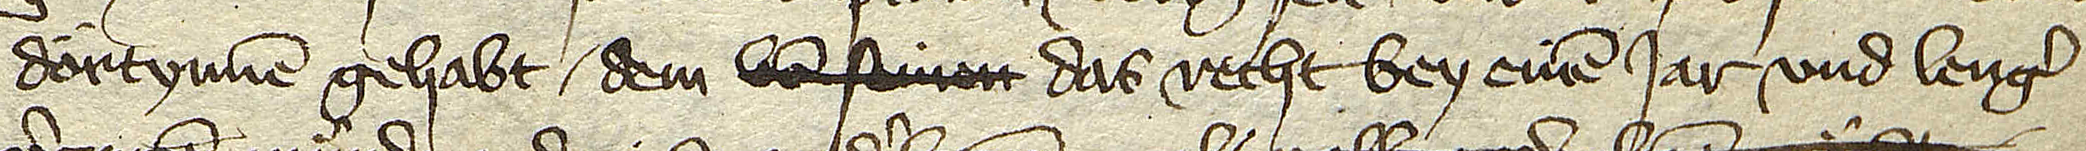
dörtynne* gehabt / dem vo* ſeinen das recht bey eine* Iar vnd leng*
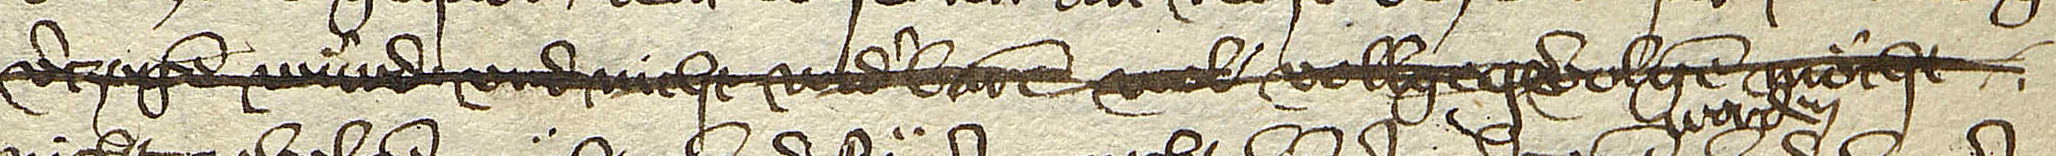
v*cʒoge* würd vnd nicht wid*vare* wol / vollgegevolge* möcht / .
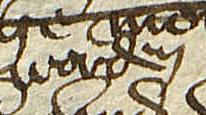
worden
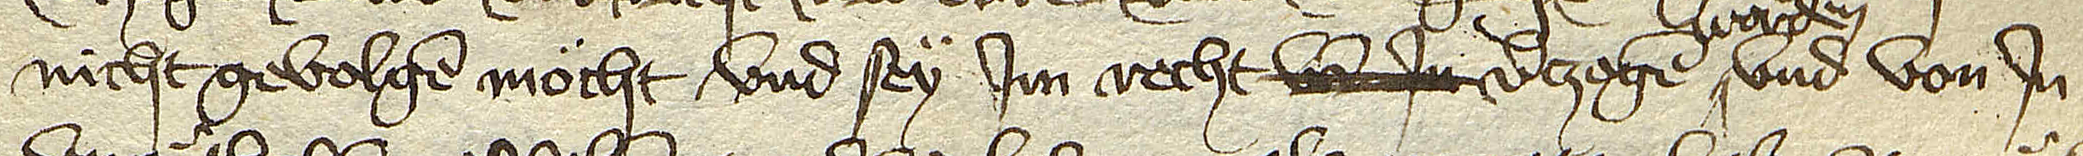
nicht gevolge* möcht / vnd ſey Im recht vo* In v*cʒoge* / vnd von In
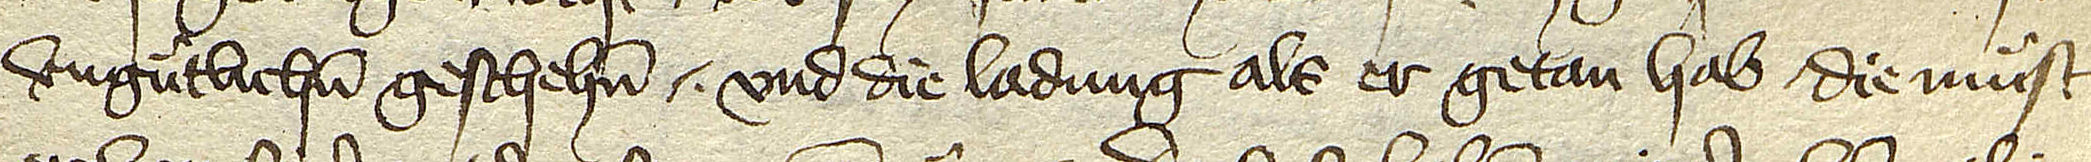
vngütlichn* geſchehn* / . vnd die ladung als er getan hab / die müſt
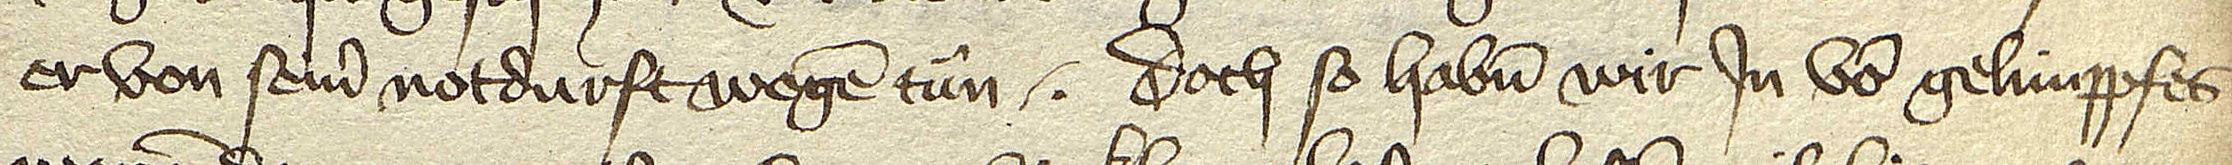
er von ſein* notdurft wege* tün / . Doch ſo habn* wir In vo* gelimppfes
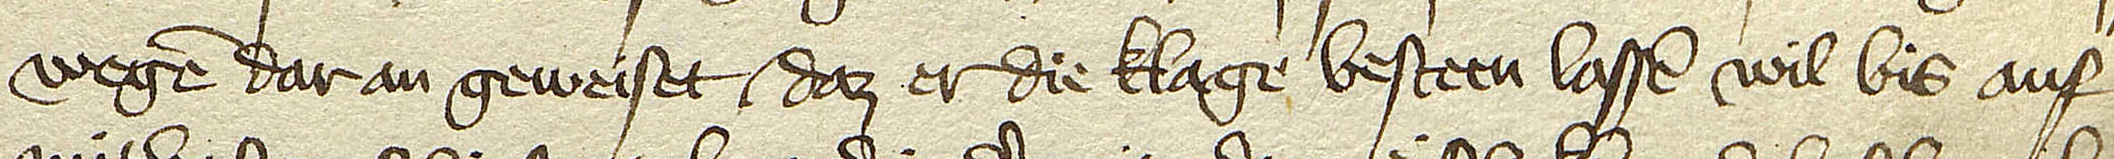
wege* daran geweiſet / daʒ er die klage beſteen laſſe* wil bis auf
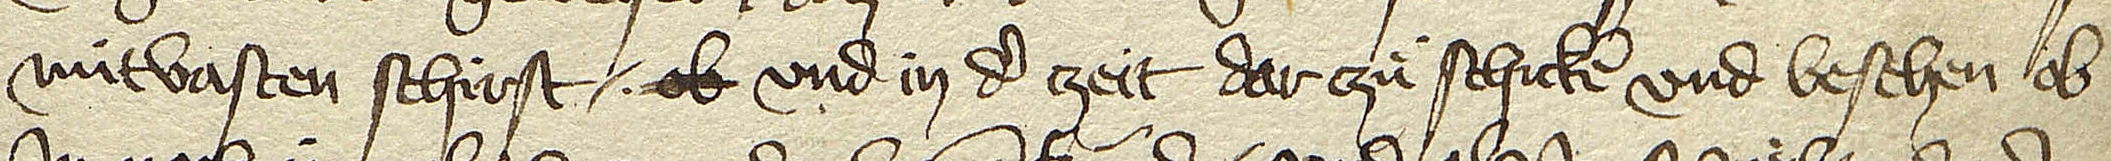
mitvaſten ſchirſt / . ob vnd in d* cʒeit dar cʒü ſchicke* vnd beſehen ob
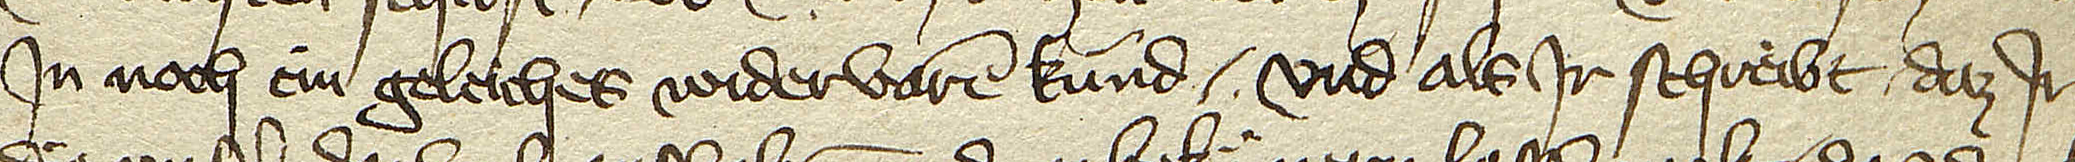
In noch ein geleiches widervare* künd / . vnd als Ir ſchreibt / daʒ Ir
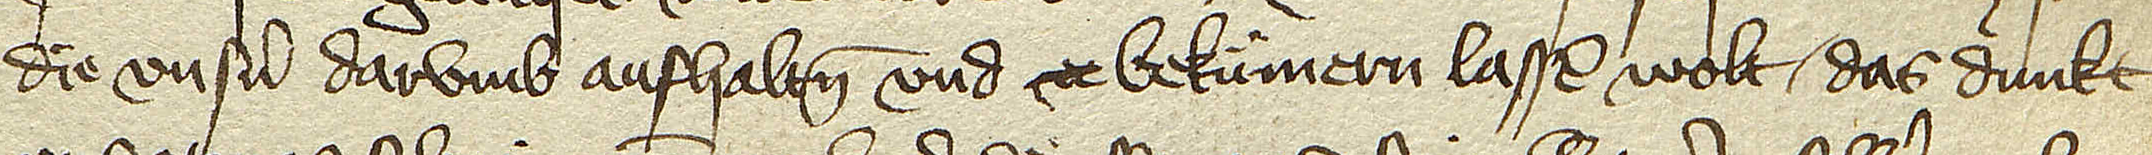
die vnſn* darvmb aufhaltn* vnd %% bekümern laſſe* wolt / das dunkt
